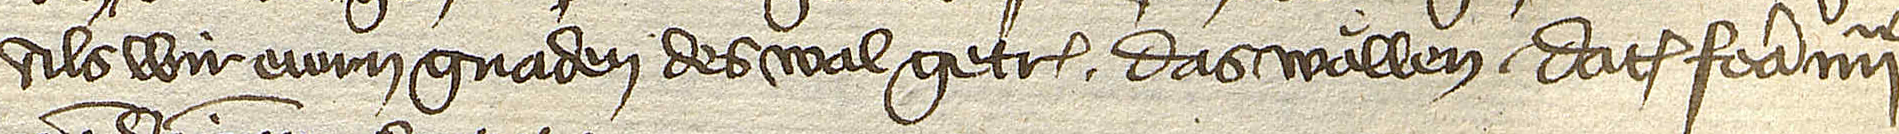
Als wir ewrn gnaden des wol getr* . Das wöllen / Dat* fea* iiii*
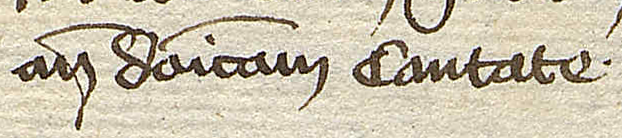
an* doicam* Cantate .
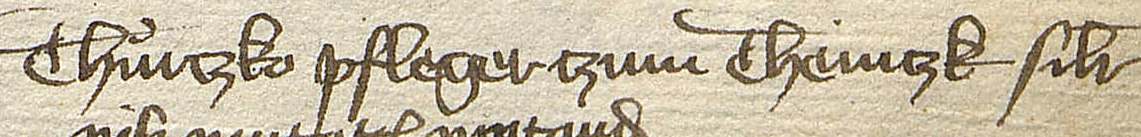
Türcʒko pfleger cʒum Theincʒk ſilr*
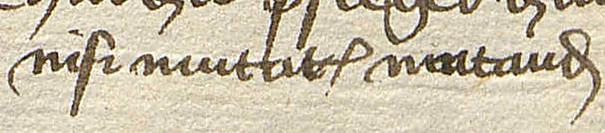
niſi mutat* mutand*
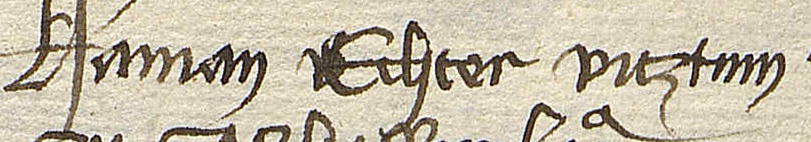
Haman Echter vicʒtum
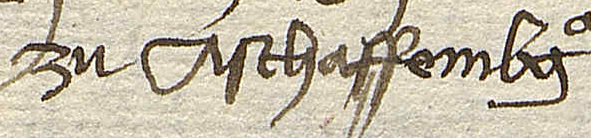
ʒu Aſchaffemb*g
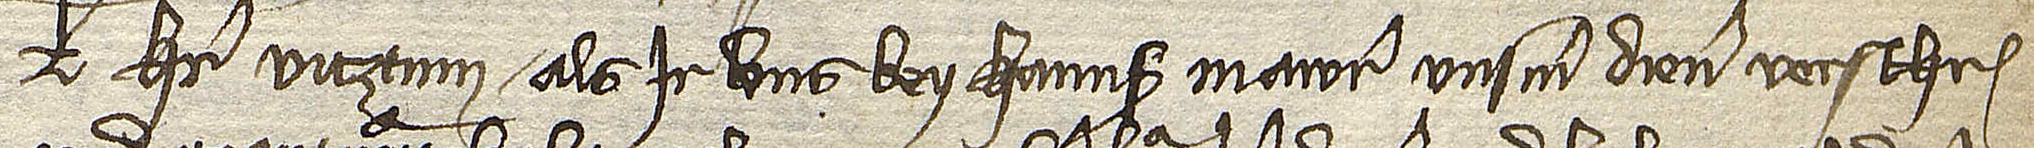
L* Hr* vicʒtum / als Ir vns bey hannſ* mawr* vnſm* dien* verſchr*
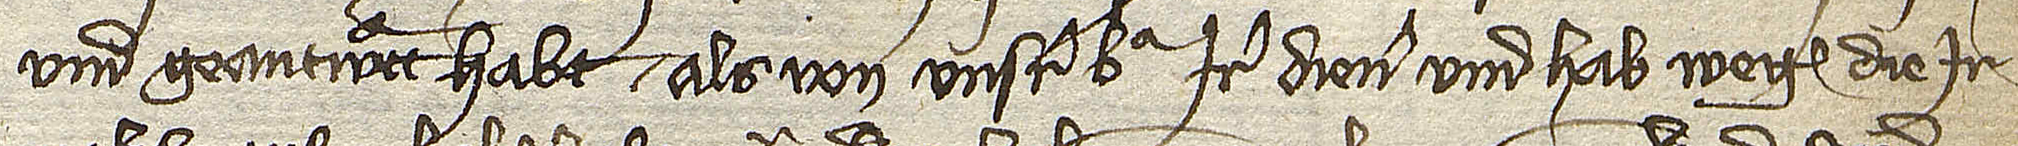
vnd geantw*tt habt / als von vnſr* b* Ir* dien* vnd hab weg* die Ir
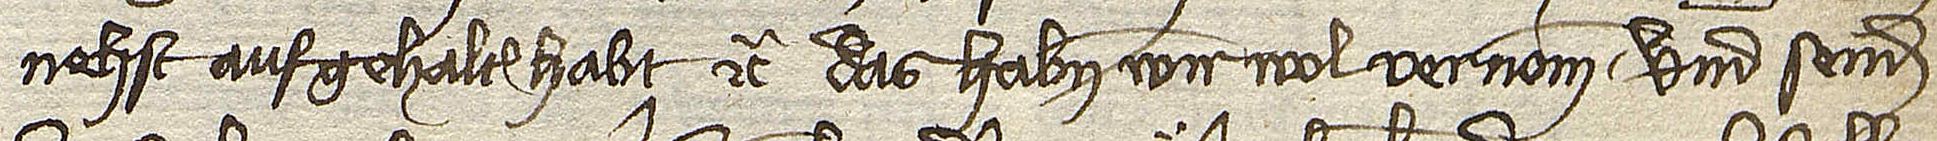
nehſt aufgehalt* habt ec* das habn* wir wol vernom* / Vnd ſend*
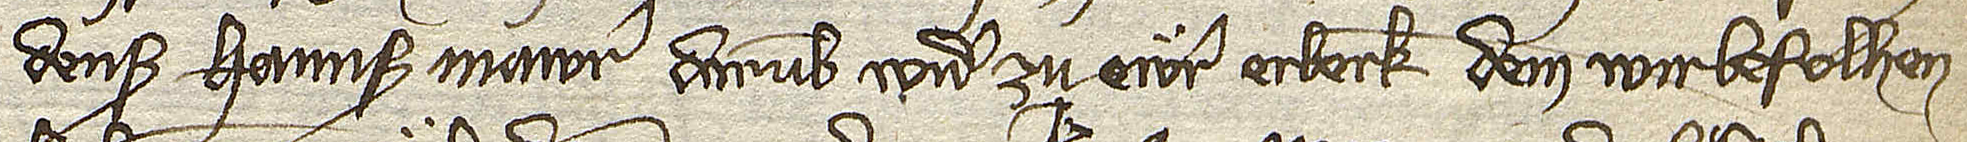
denſ* Hannſ* mawr* darub* wid* ʒu ewr* erberk* dem wir befolhen
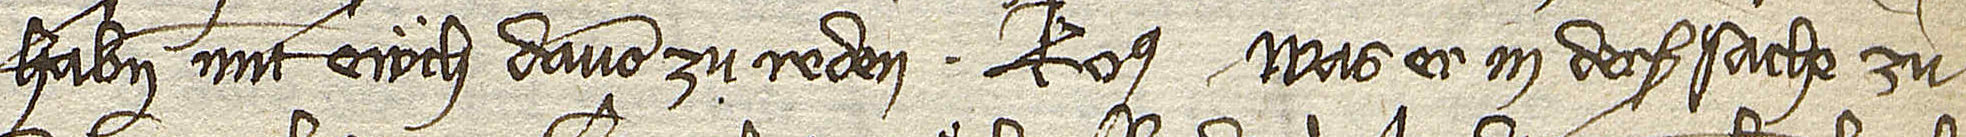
habn* mit ewch dauo* ʒu reden . Ro* / was er in derſ* ſache ʒu
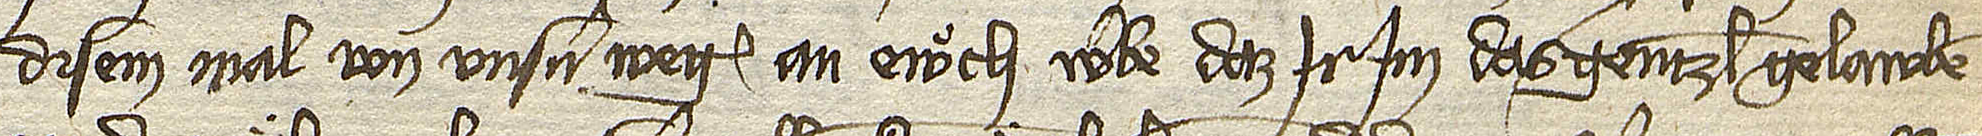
diſem mal von vnſn* weg* an ewch w*be daʒ Ir Im das gencʒl* gelawbe*
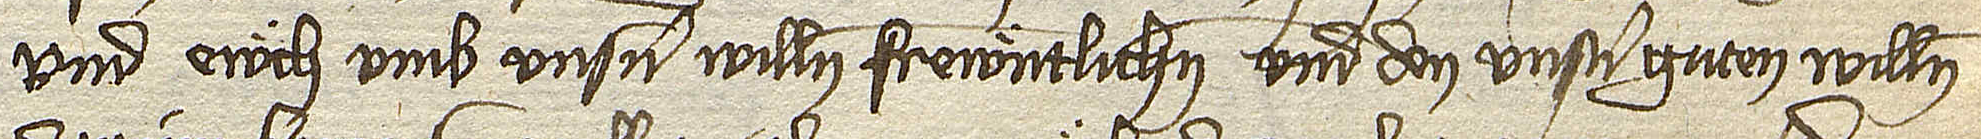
vnd ewch vmb vnſn* willn* frewntlichn* vnd den vnſn* guten willn*
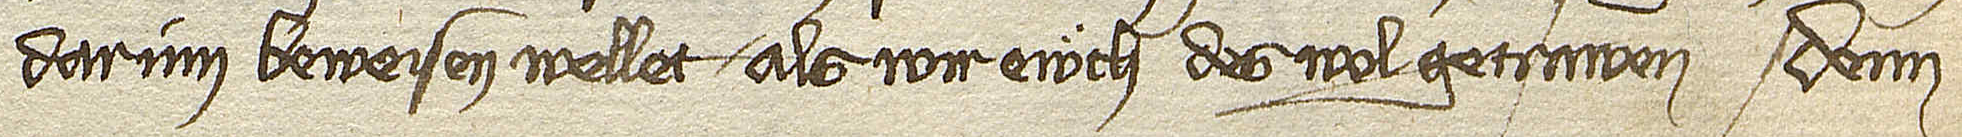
darinn beweiſen wellet / als wir ewch des wol getrawen / Denn
